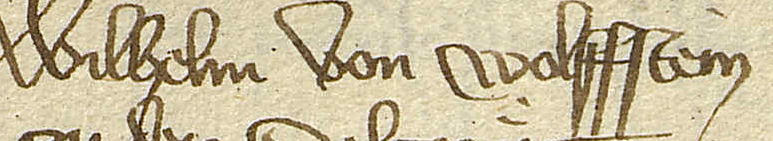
Wilhelm von wolffſtein
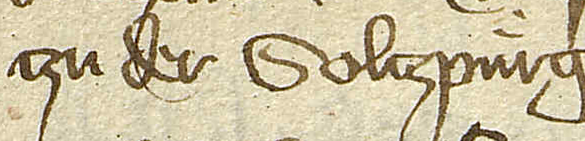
cʒu der Solcʒpürg
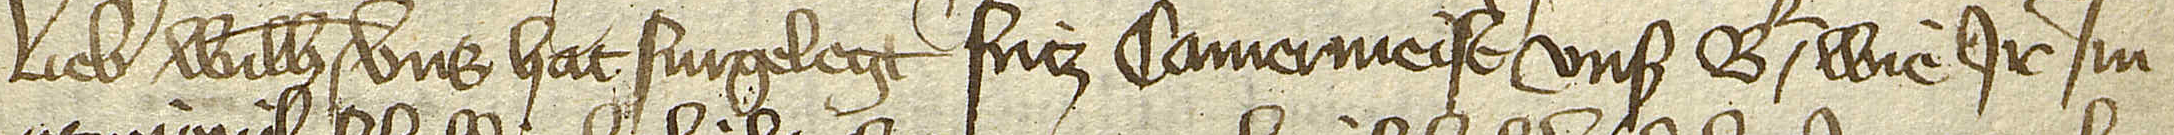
Lieb* Wilh* / Vns hat furgelegt fricʒ Camermeiſt* vnſ* B* / wie Ir Im
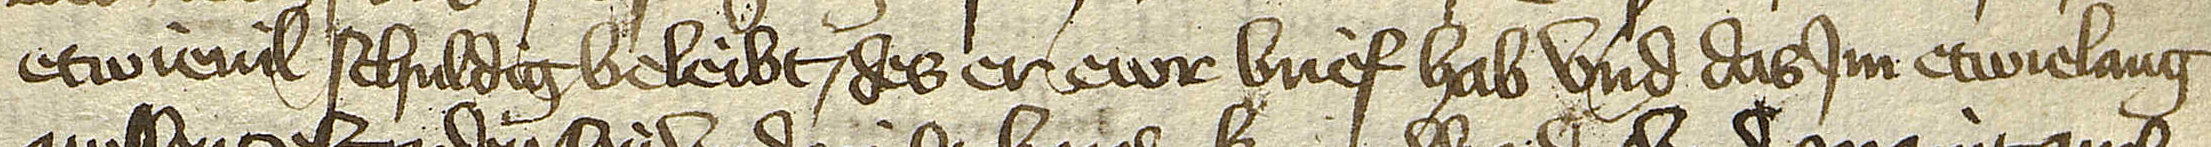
etwieuil ſchuldig beleibt / des er ewr brief hab vnd das Im etwielang
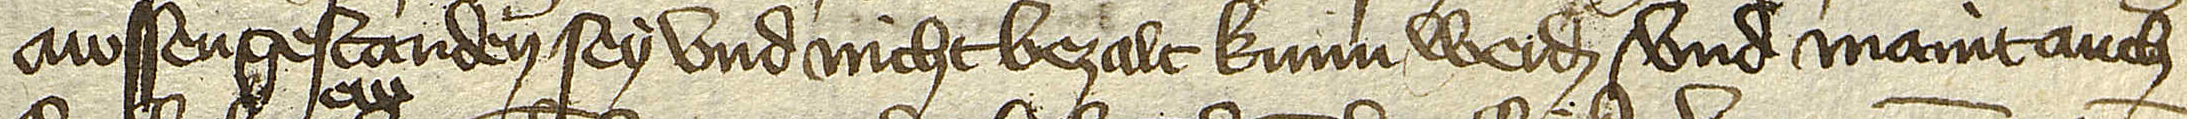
awſſengeſtanden ſey vnd nicht beʒalt kunn werd* / vnd maint auch
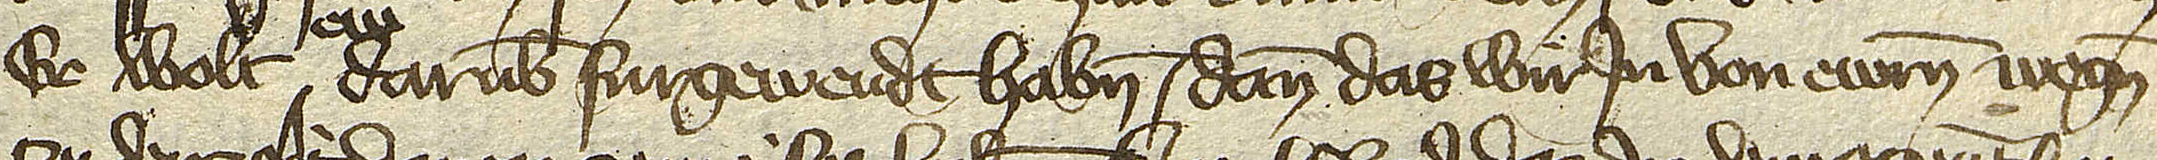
Er wolt darub* furgewendt habn* / dan* das wir In von ewrn* wegn*
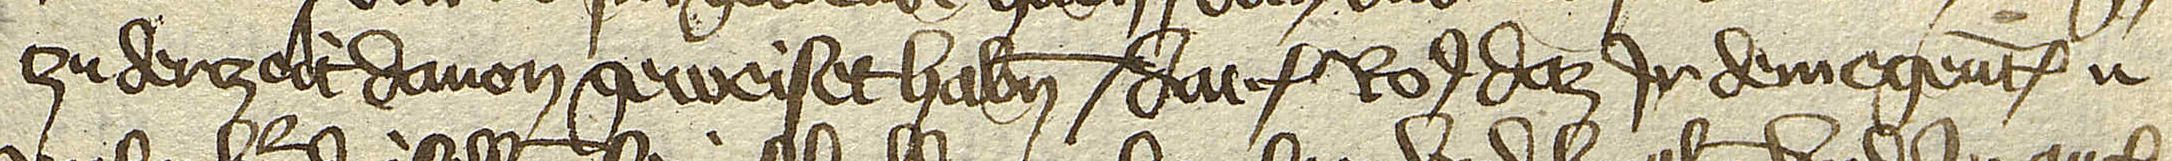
cʒu dercʒeit dauon geweiſet habn* / dar* Ro* daʒ Ir dem egent* ~
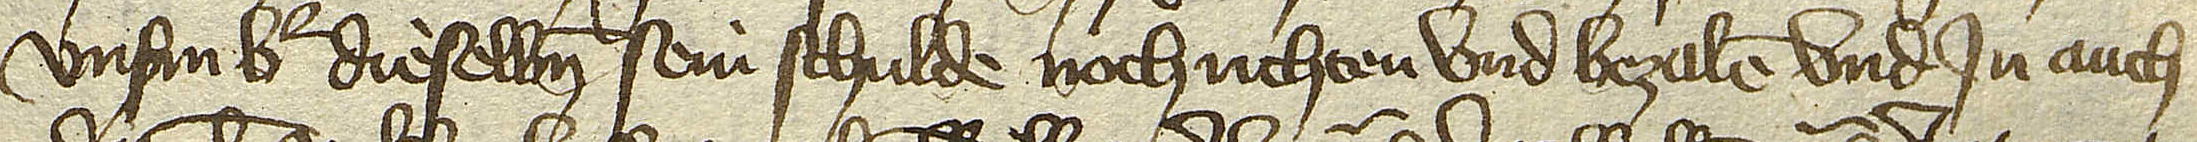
vnſ*m B* dieſelbn* ſein ſchulde noch richten vnd beʒale* vnd In auch
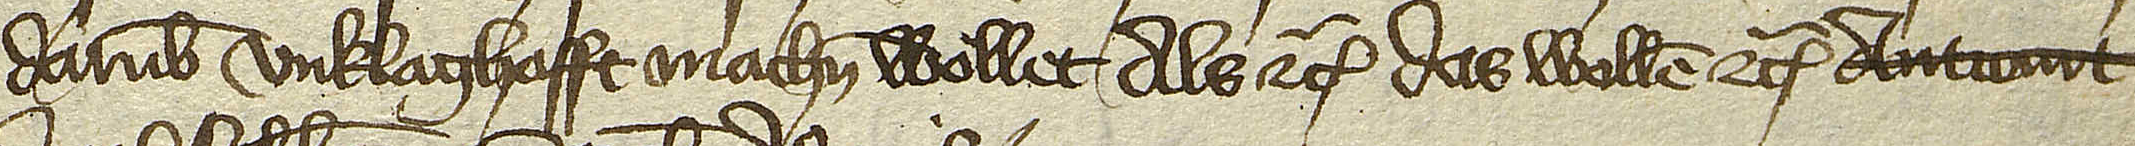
darub* vnklaghafft machn* wöllet Als ec* das wolle* ec* Antwurt
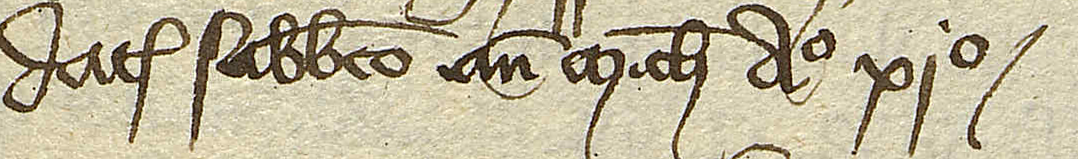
dat* ſabbto* an* Mich* A* xi* /
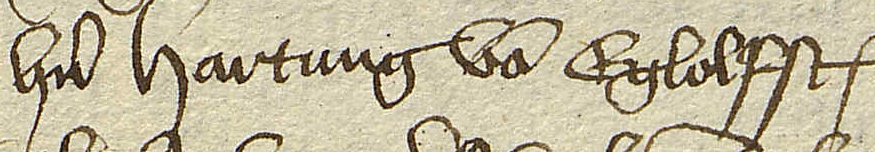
en* Hartung vo* Eglolfſt*
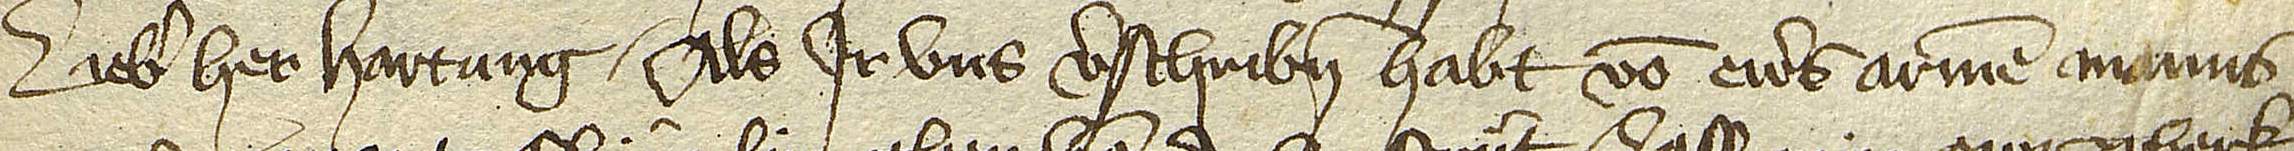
Lieb* her hartung / Als Ir vns v*ſchribn* habt vo* ew*s arme* manns
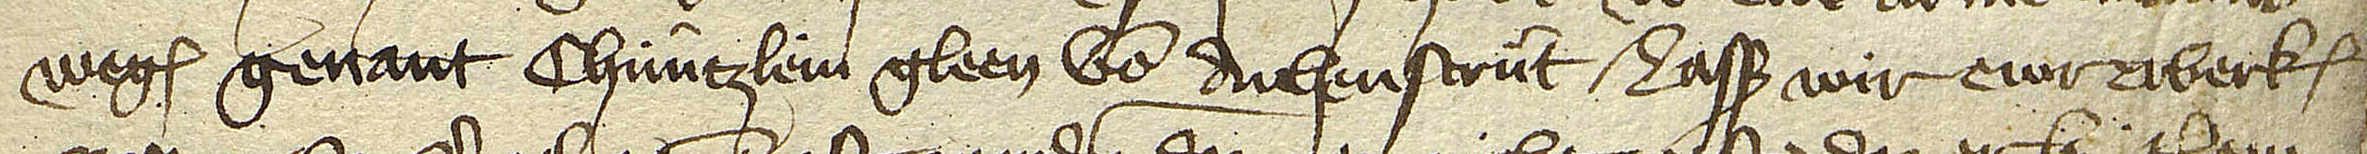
weg* genant Chüncʒlein gleen vo* Aihenſtrüt / Laſſ* wir ewr erberk*
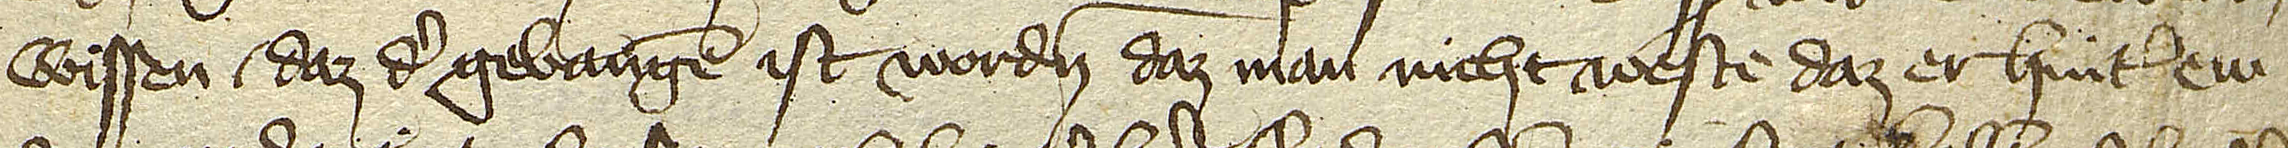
wiſſen / daʒ d* gevange* iſt wordn* daʒ man nicht weſte daʒ er hint* ew
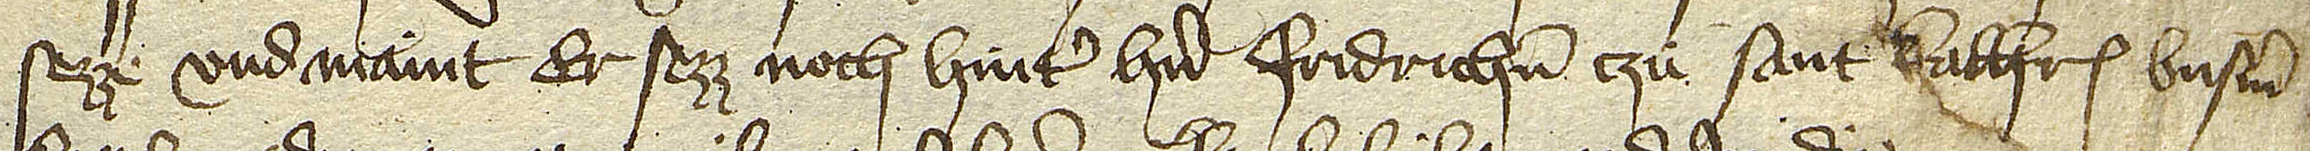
ſeʒʒe vnd maint Er ſeʒʒ noch hint* hn* Fridrichn* cʒü ſant Kathr* vnſm*
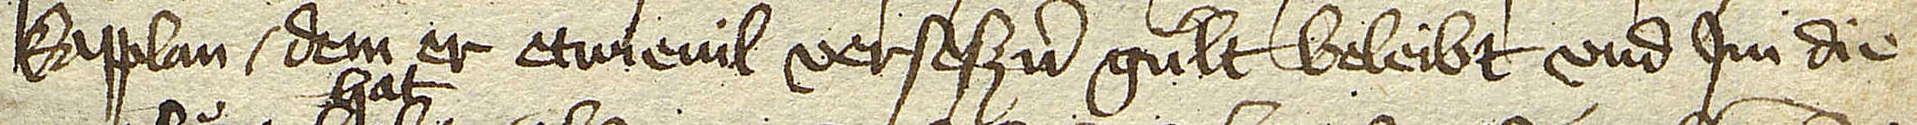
kapplan / dem er etwieuil verſeſʒn* gült beleibt vnd Im die
